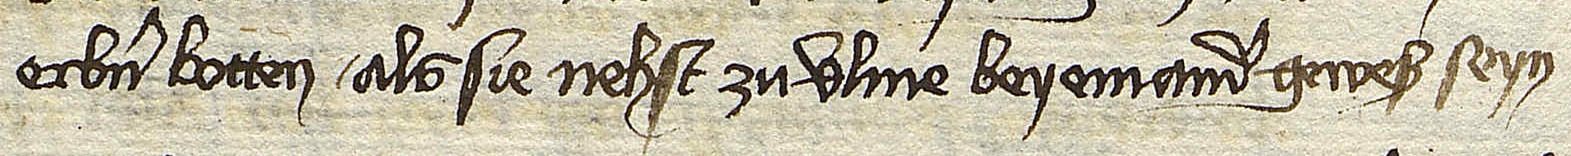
erb*n botten / als ſie nehſt ʒu Vlme beyeinand* geweſ* ſeyn
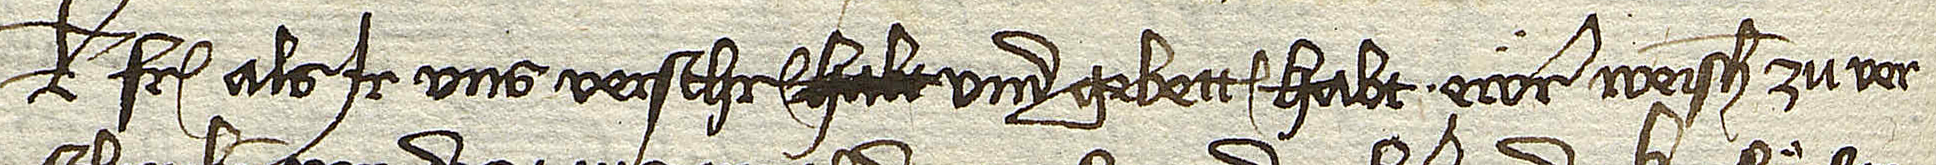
L* fr* als Ir vns verſchr* habt vnd gebett* habt . ew*r weiſh* ʒu ver
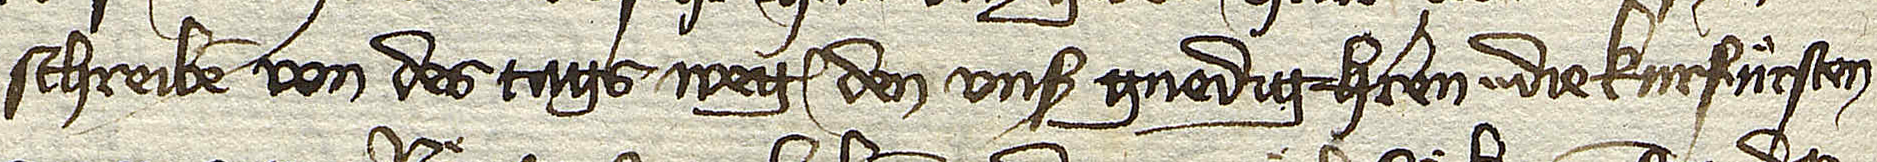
ſchreibe* von des tags weg* den vnſ* gnedig h*ren ~ die kurfürſten
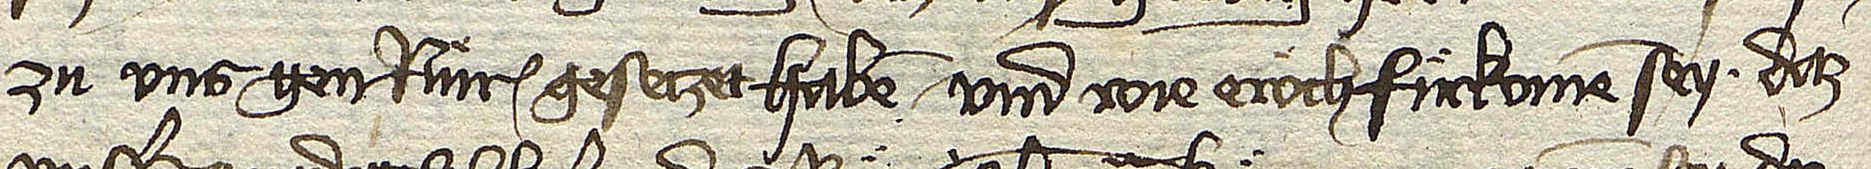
ʒu vns gen Nür* geſecʒet habe* / vnd wie ewch fürkome* ſey . daʒ
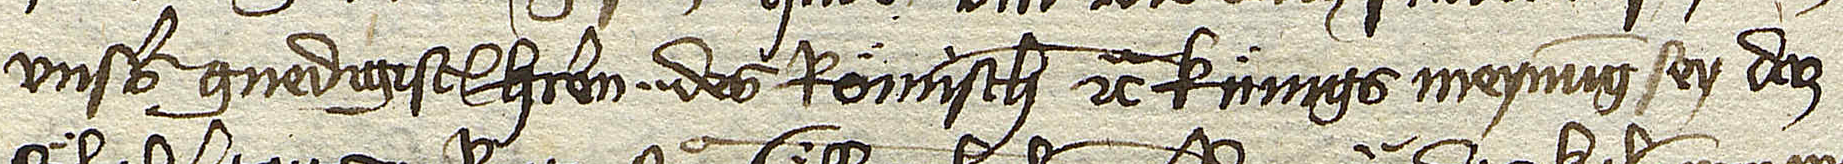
vnſ*s gnedigiſt* h*ren ~ des Römiſch* ec* künigs meynu*g ſey daʒ
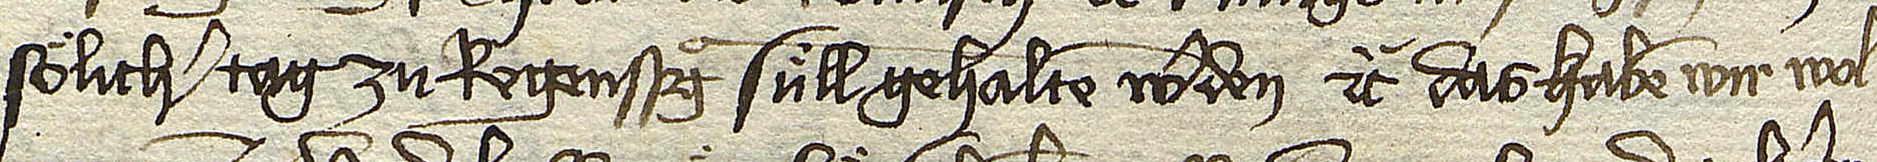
ſölich* tag ʒu Regenſp*g ſüll gehalte* w*den ec* das habe* wir wol
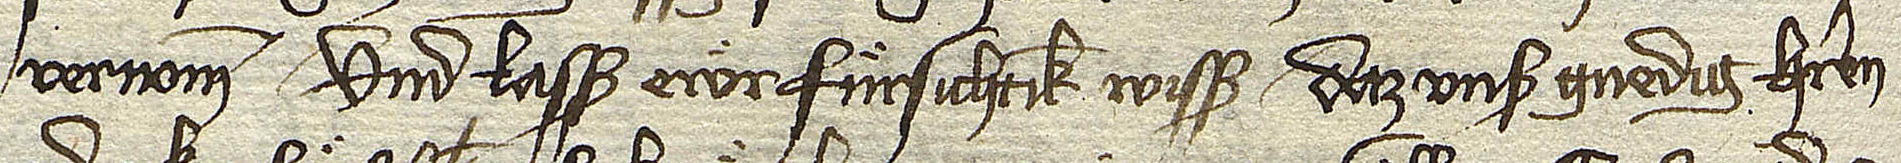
vernom* / Vnd laſſ* ewr fürſichtik* wiſſ* / Daʒ vnſ* gnedig h*ren
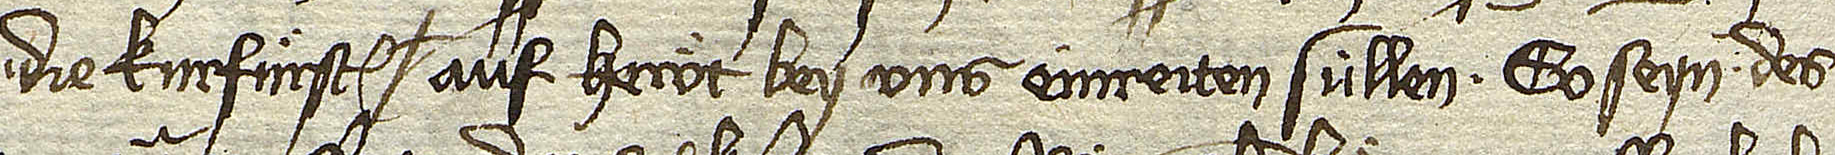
~ die kurfürſt* / auf hewt bey vns einreiten ſüllen . So ſeyn . des
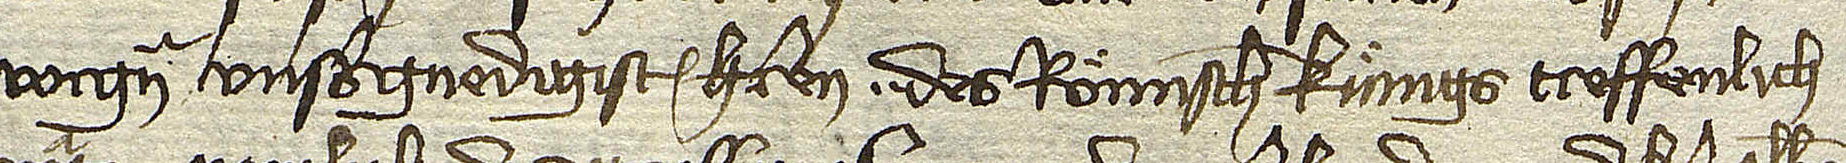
vorg*n vnſ*s gnedigiſt* h*ren ~ des Römiſch* künigs treffenlich
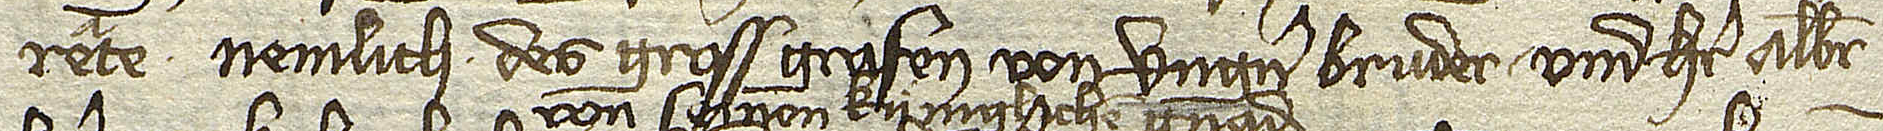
rëte . nemlich . des groſſ grafen von Vng*n bruder / vnd h*r albr*
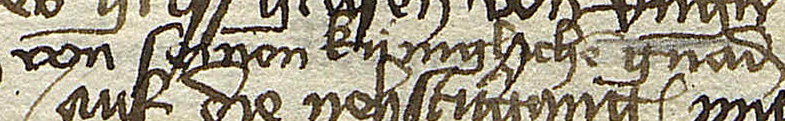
von ſeinen künigliche* gnad*
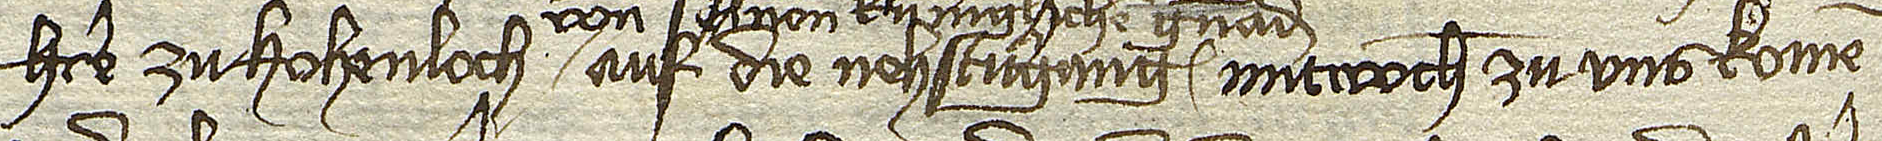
h*re ʒu hohenloch . auf die nehſtu*gang* mitwoch* ʒu vns kome*
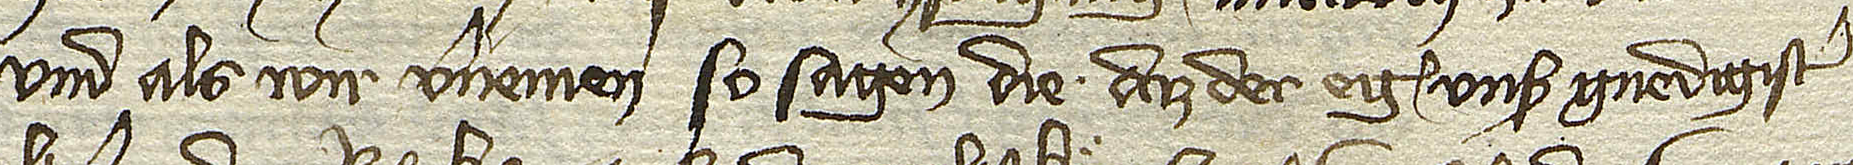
vnd als wir v*nemen ſo ſagen die . daʒ der eg* vnſ* gnedigiſt*
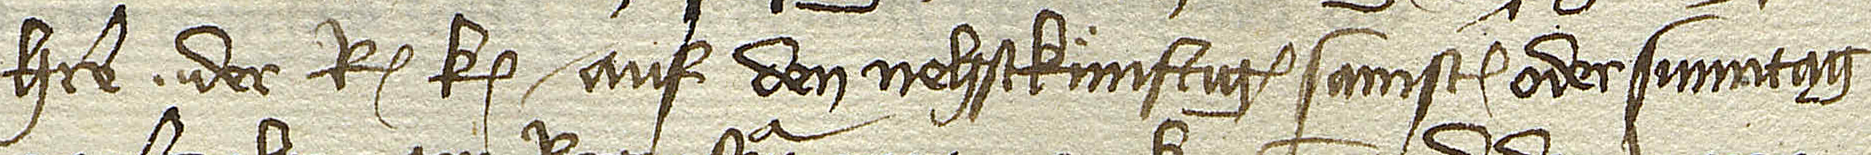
h*re ~ der R* k* / auf den nehſtkünftig* ſamſt* oder ſunntag
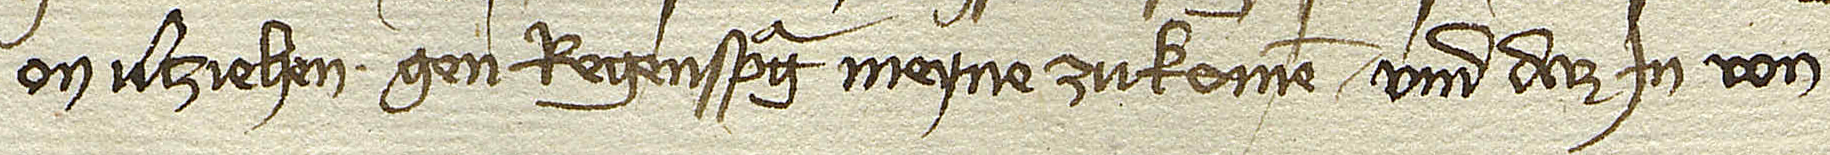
on v*cʒiehen . gen Regenſp*g meyne ʒu kome* / vnd daʒ In von
